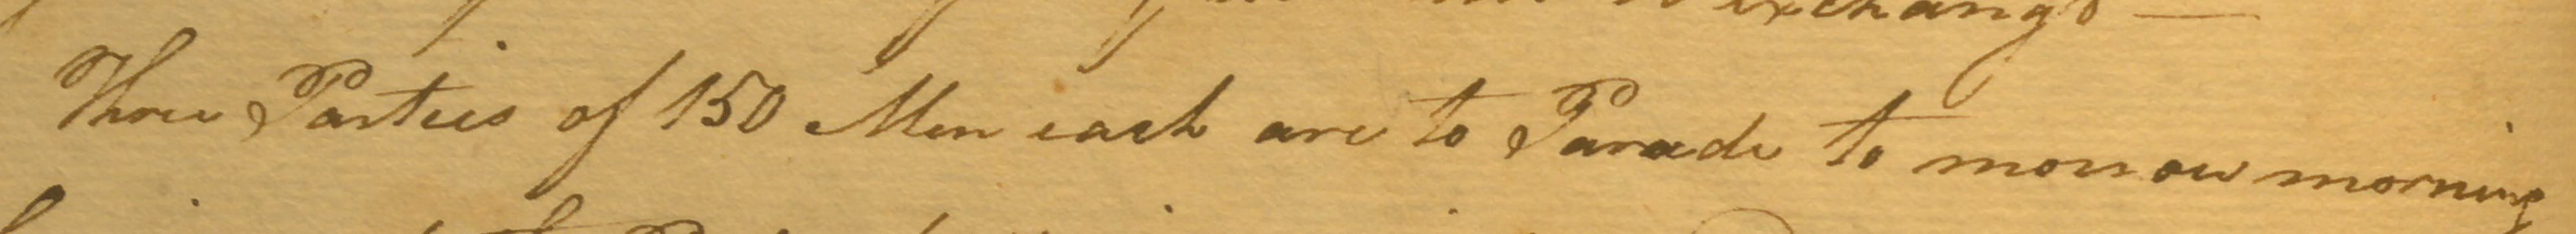Three Parties of 150 Men each are to Parade to morrow morning
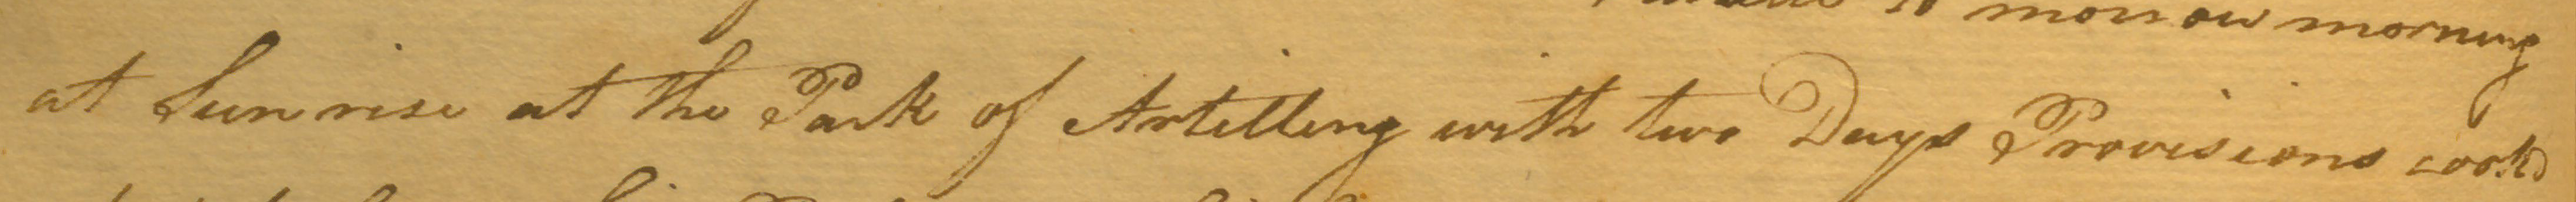at Sunrise at the Park of Artillery with two Days Provisions cookd
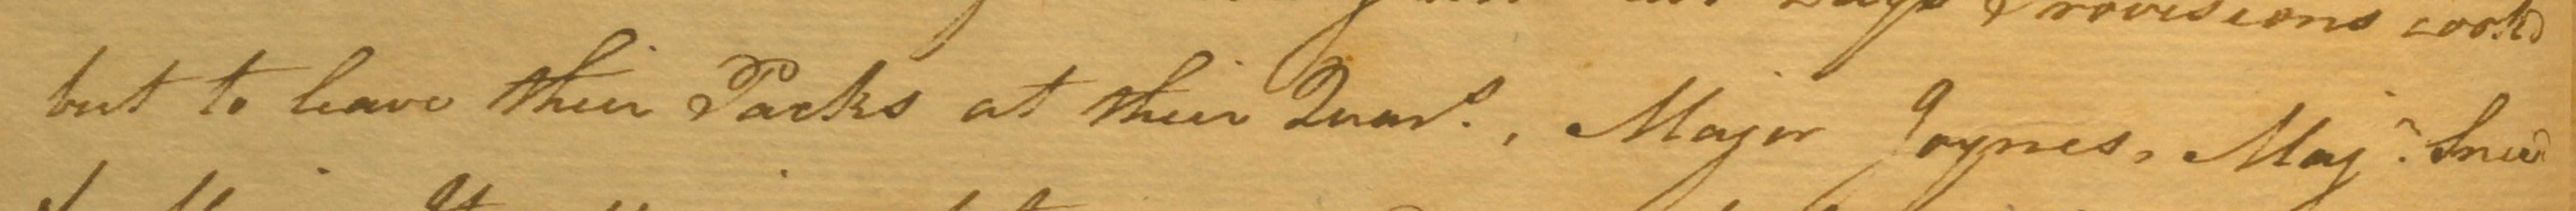but to leave their Packs at their Quar^s., Major Joynes, Maj^r. Sneed
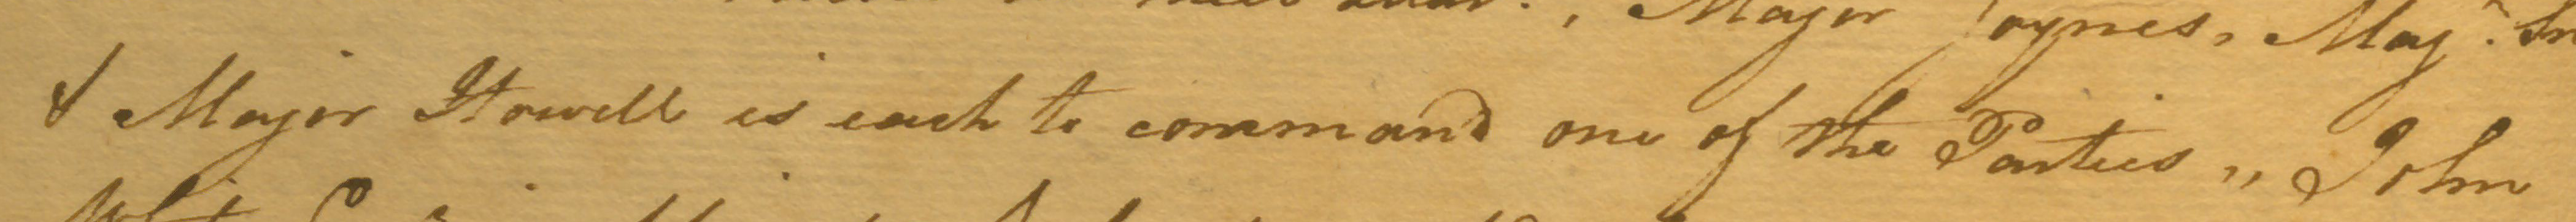& Major Howell is each to command one of the Parties. John
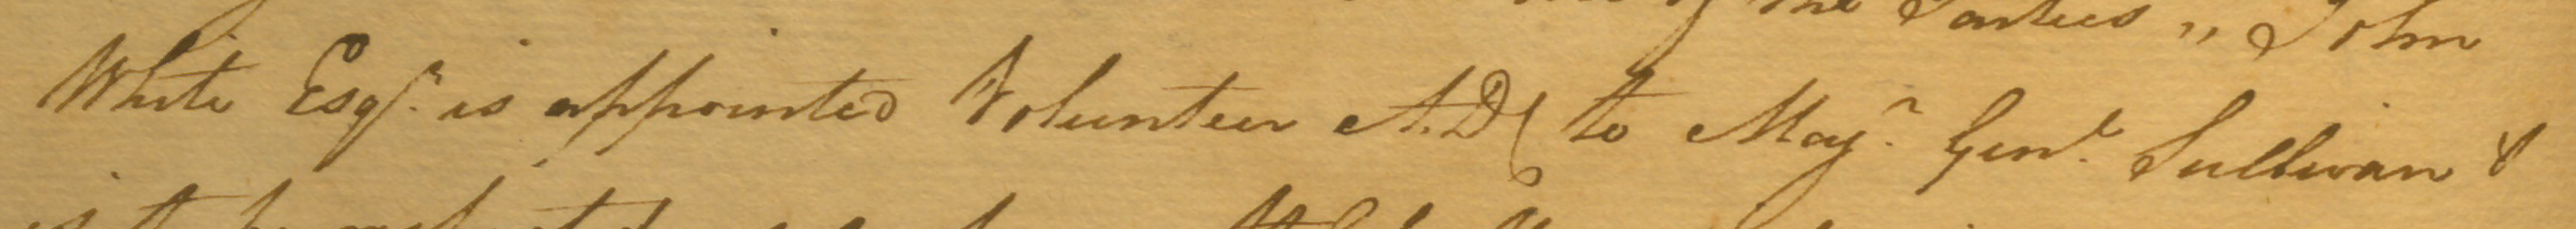White Esq^r. is appointed Volunteer A.DC to Maj^r. Gen^l. Sullivan &
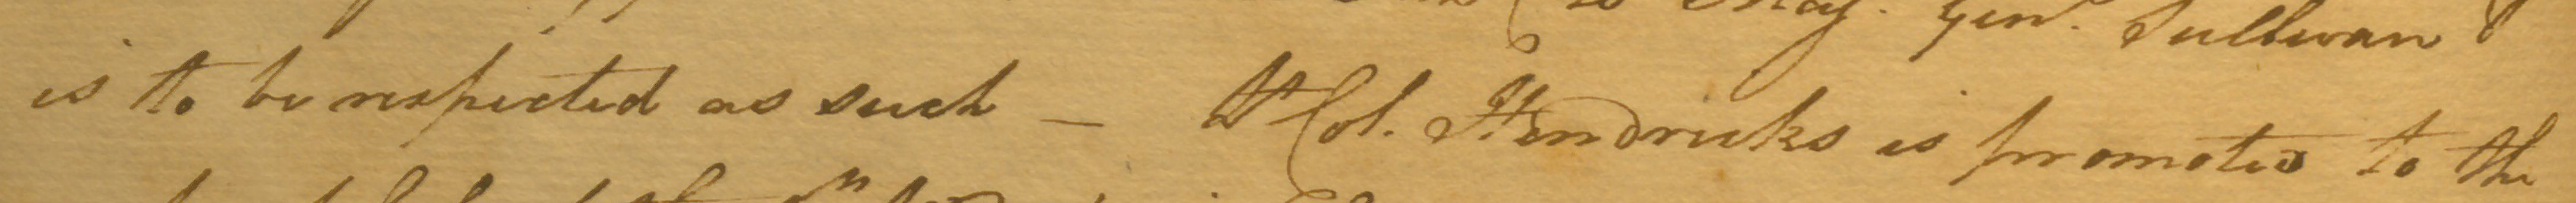is to be respected as such- L^t. Col. Hendricks is promoted to the
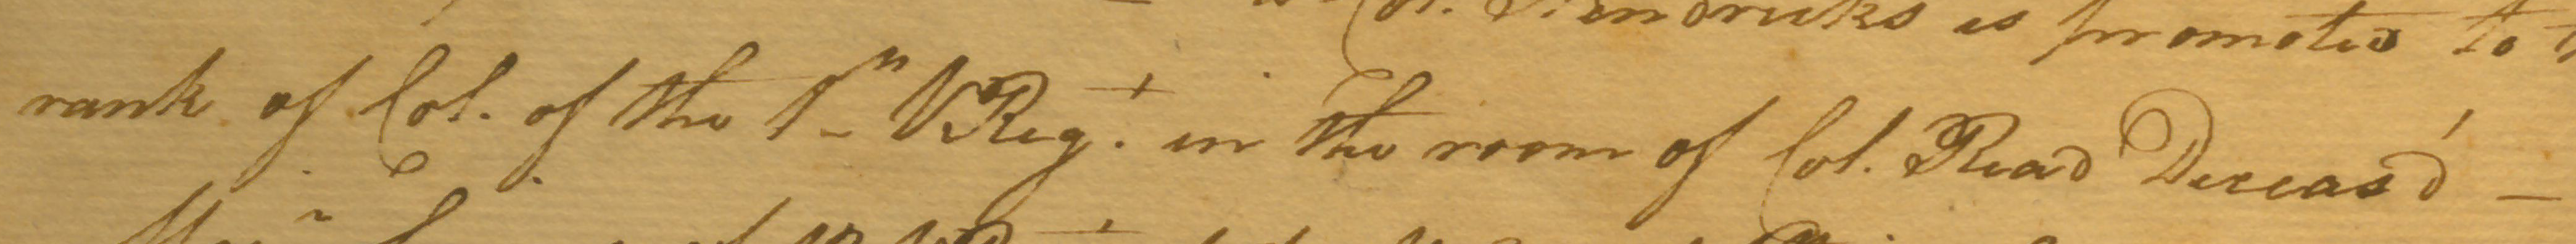rank of Col. of the 1^t V Reg^t. in the room of Col. Read Deceas'd-
